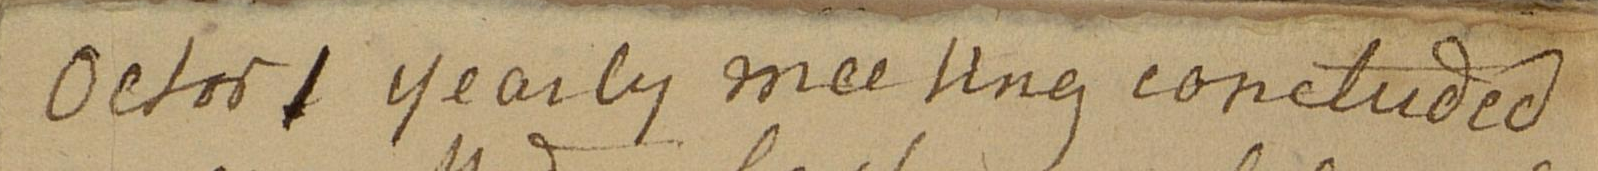Octor 1 yearly meeting concluded
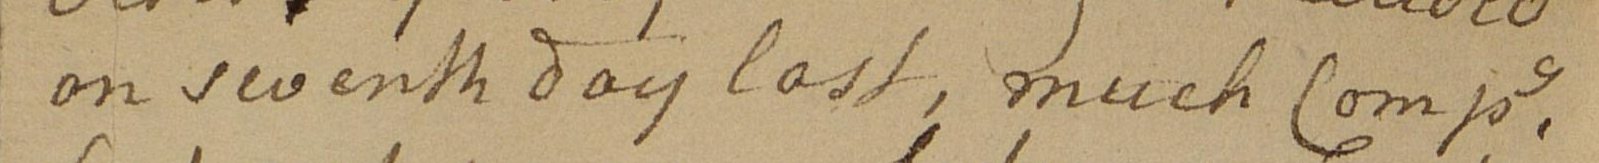on seventh day lost, much Comp^y.
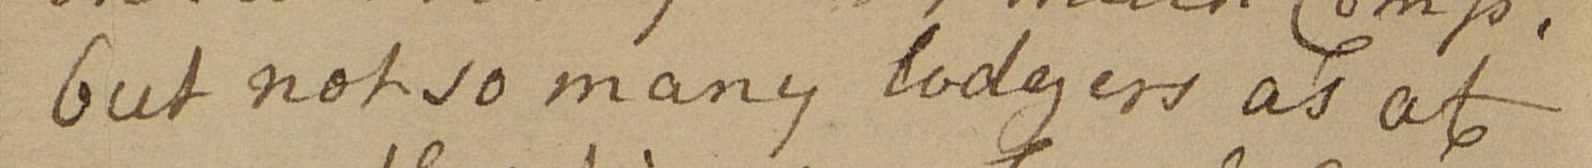but not so many lodgers as at
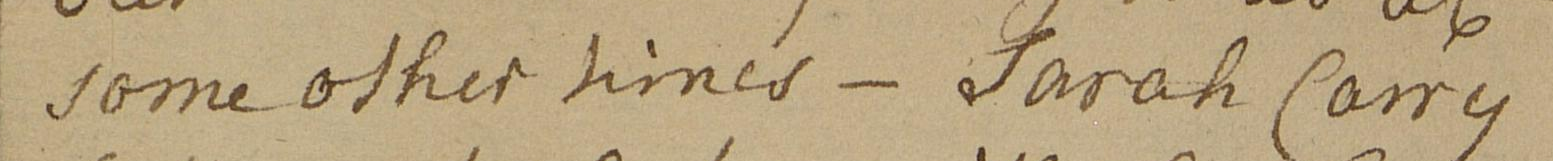some other times- Sarah Carry
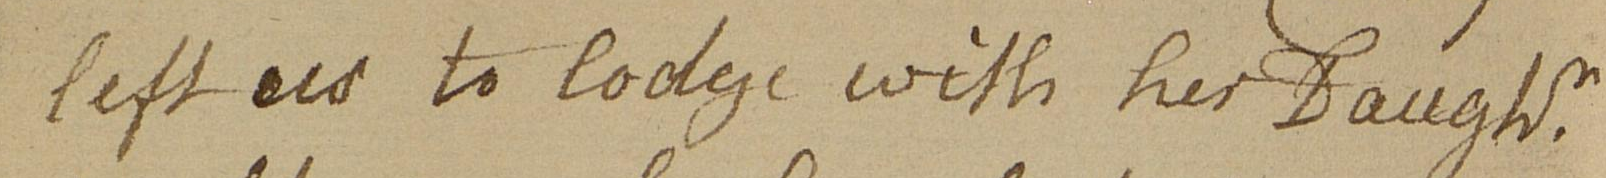left us to lodge with her Daugh^r.
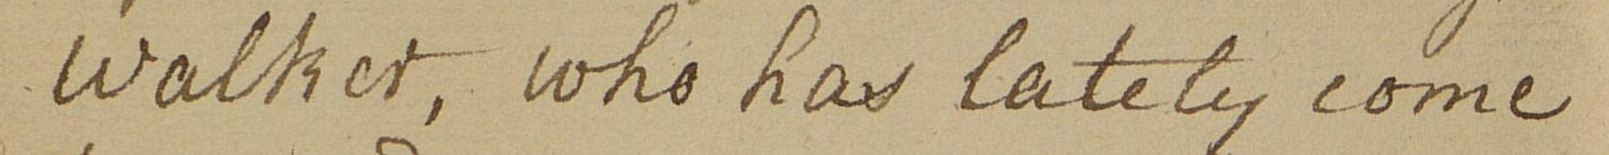Walker, who has lately come
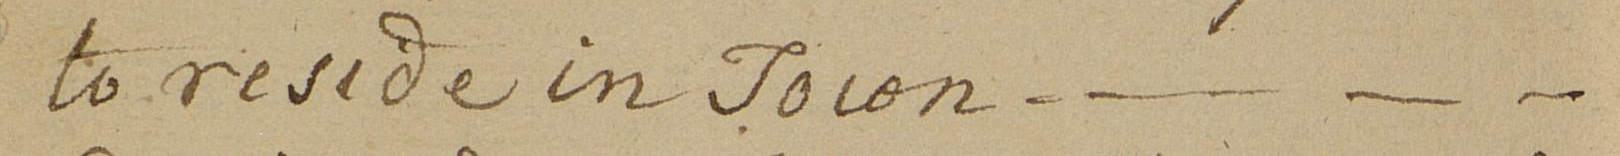to reside in Town--
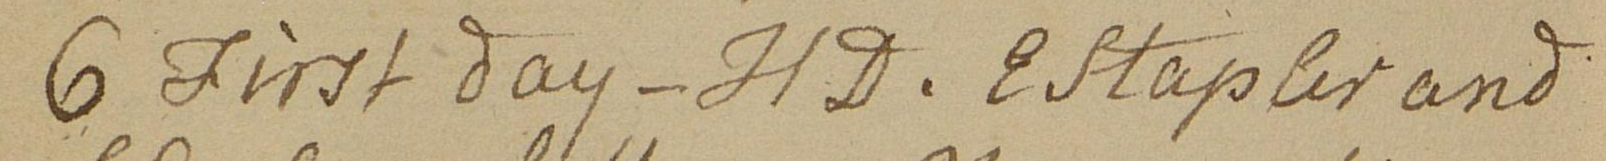6 First day- H D. E Stapler and
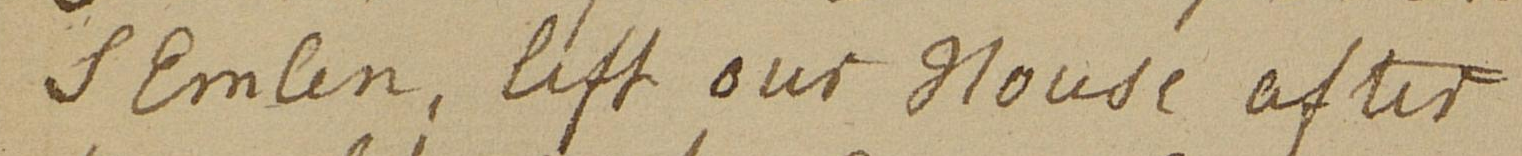S Emlen, lift our House after
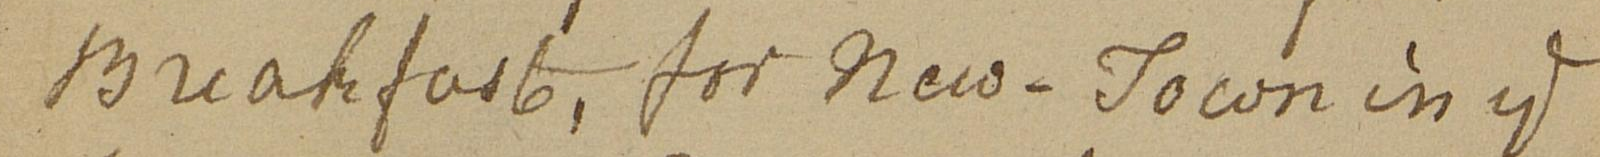Breakfast, for New-Town in y^e
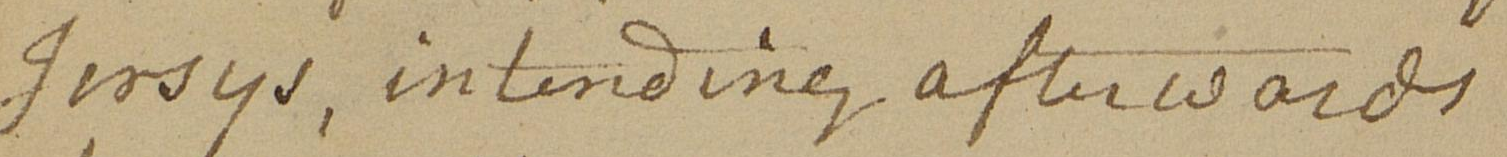Jersys, intending afterwards
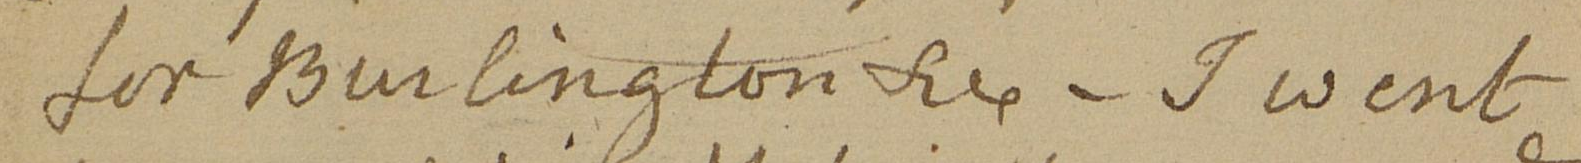for Burlington &c- I went
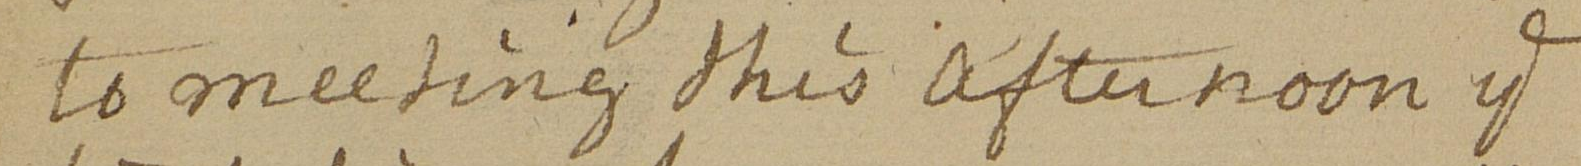to meeting this Afternoon y^e
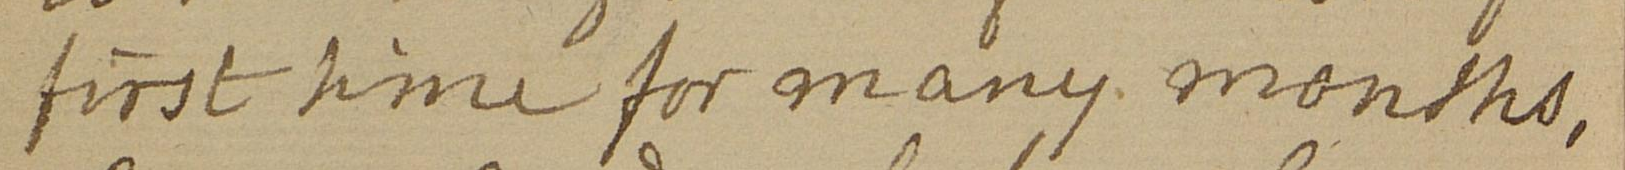first time for many months,
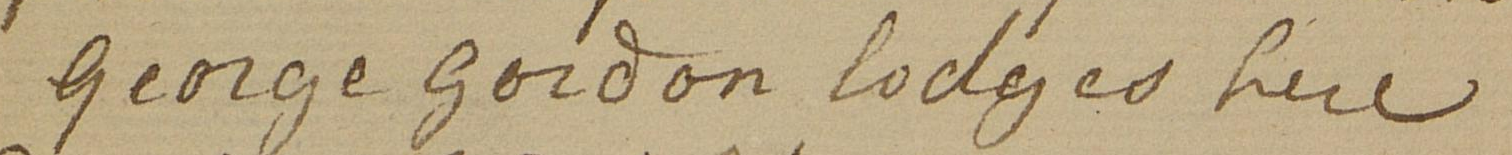George Gordon lodges here
